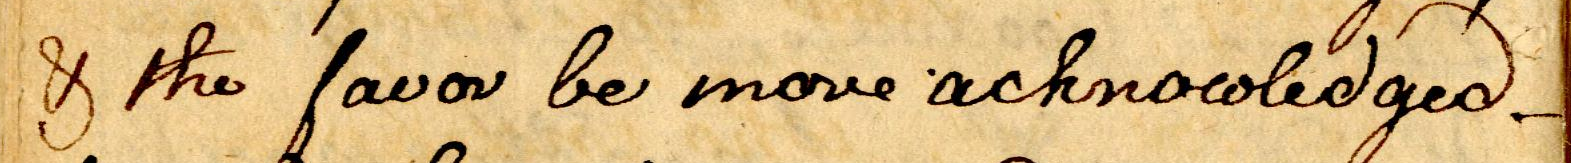& the favor be more acknowledged-
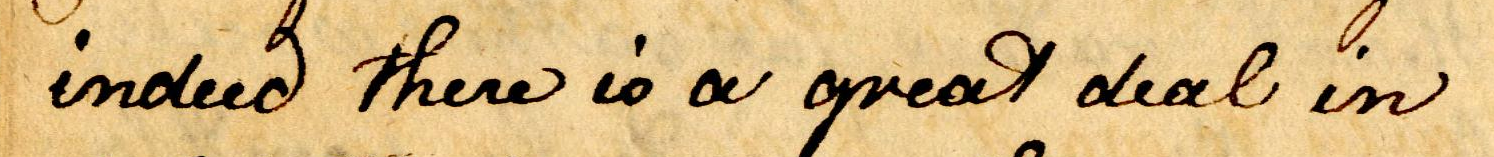indeed there is a great deal in
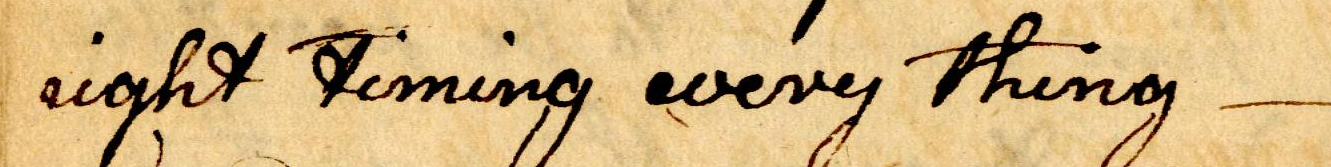right timing every thing-
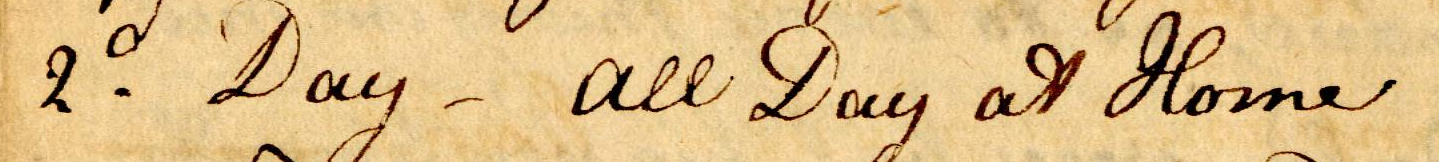2^d. Day- All Day at Home
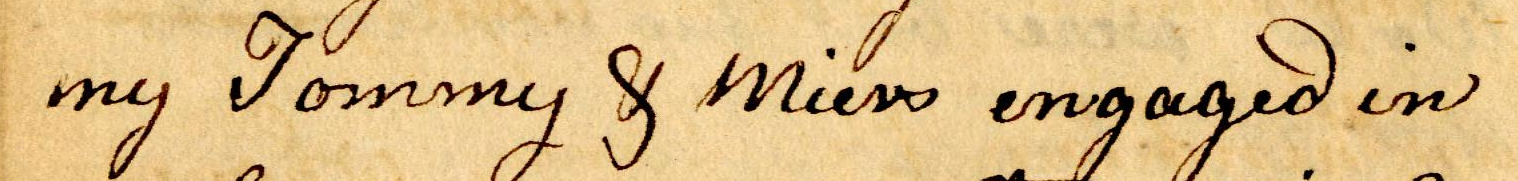my Tommy & Miers engaged in
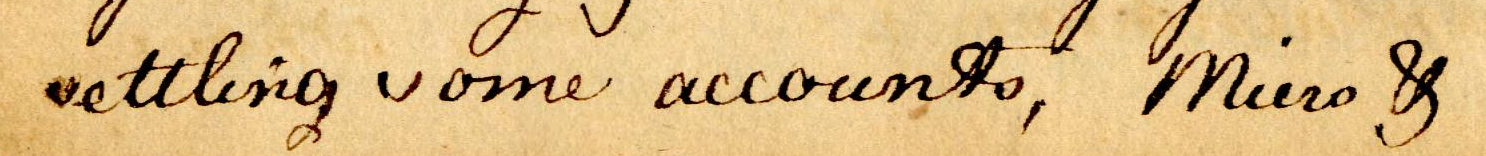settling some accounts, Miers &
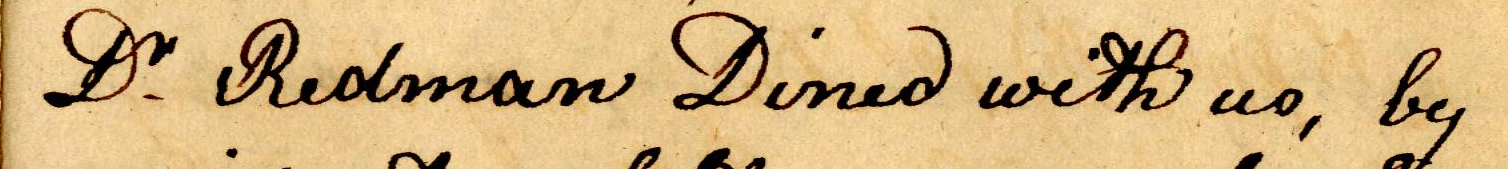D^r. Redman Dined with us, by
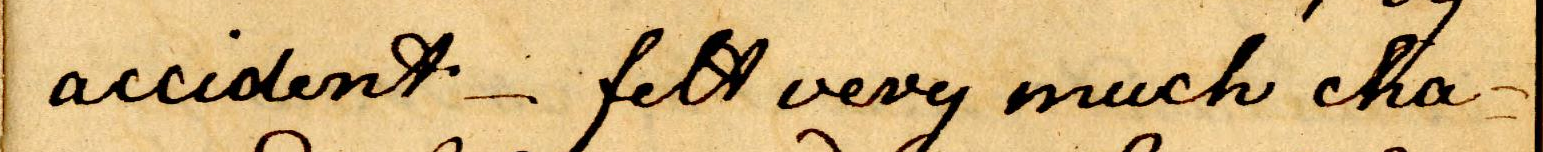accident- felt very much cha-
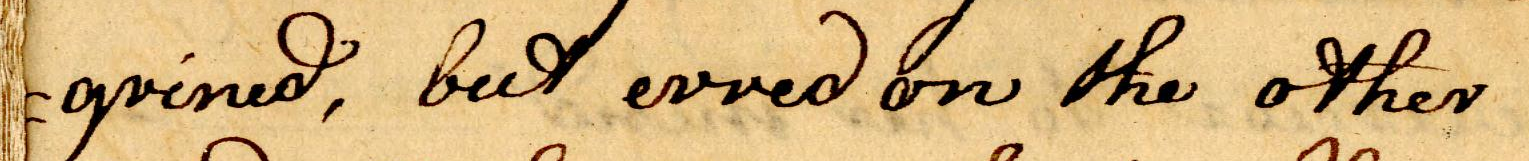-grined, but erred on the other
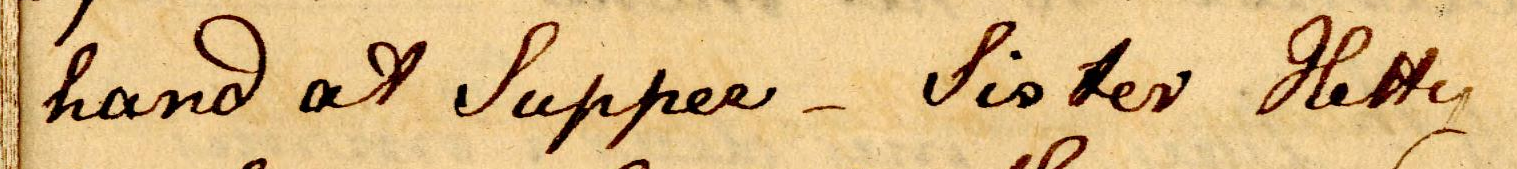hand at Supper- Sister Hetty
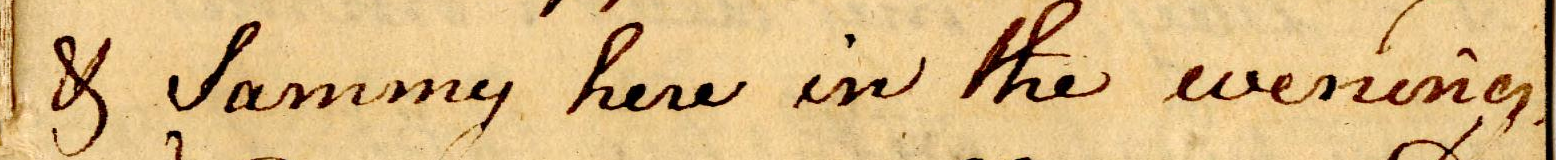& Sammy here in the evening
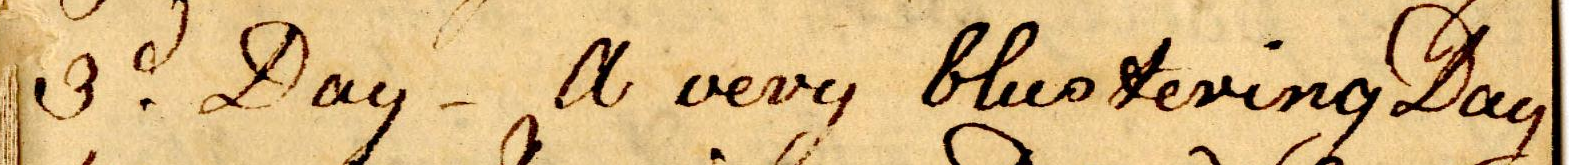3^th. Day- A very blustering Day
